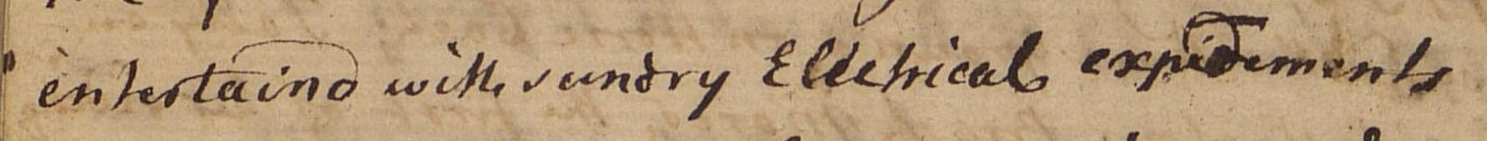entertaind will sundry Electrical expi[r]ements
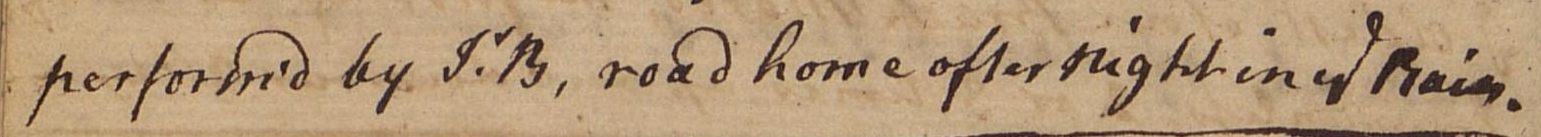perform'd by I:B, road home after night in y^e Rain.
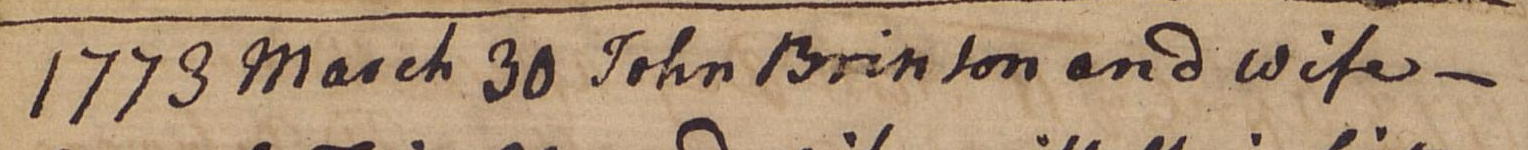1773 March 30 John Brinton and Wife-
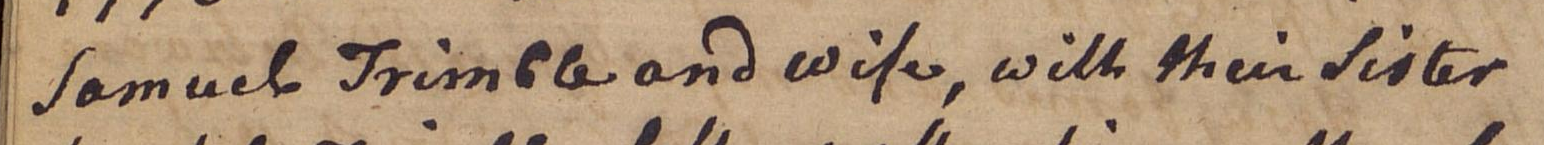Samuel Trimble and Wife, with their Sister
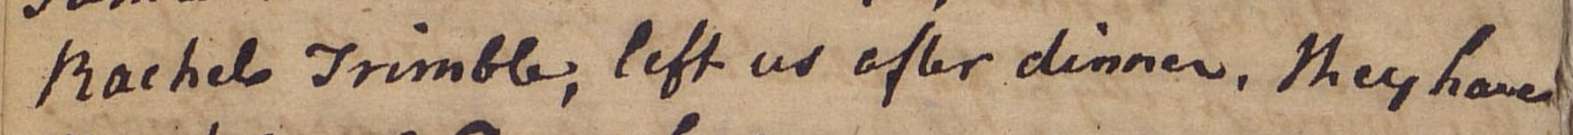Rachel Trimble, left us after dinner. they have
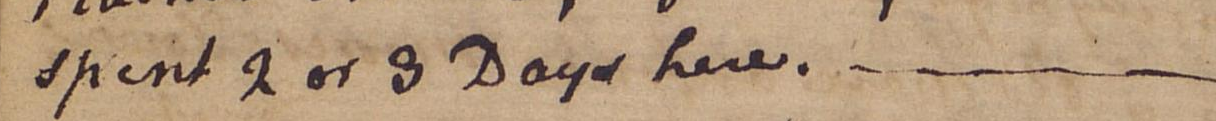spent 2 or 3 Days here.-
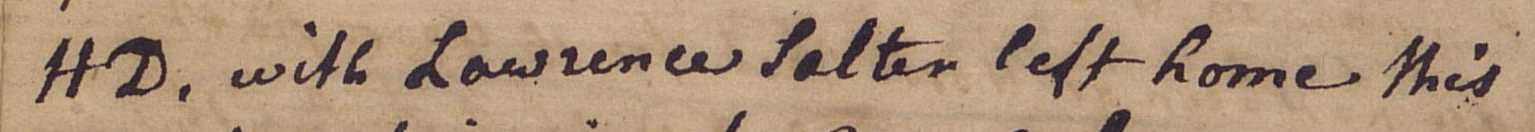HD. with Lawrence Salter left home this
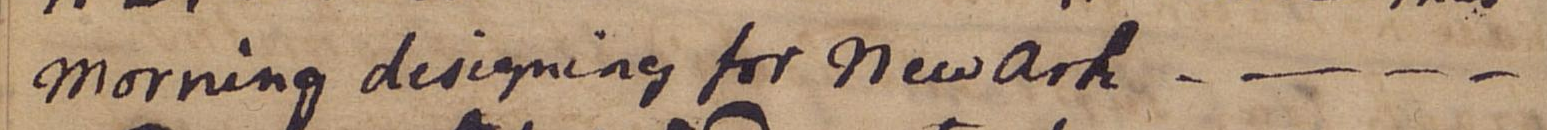Morning designing for New Ark-
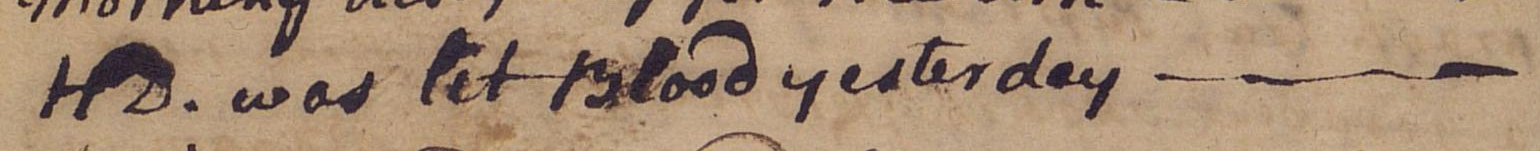HD. was let Blood yesterday-
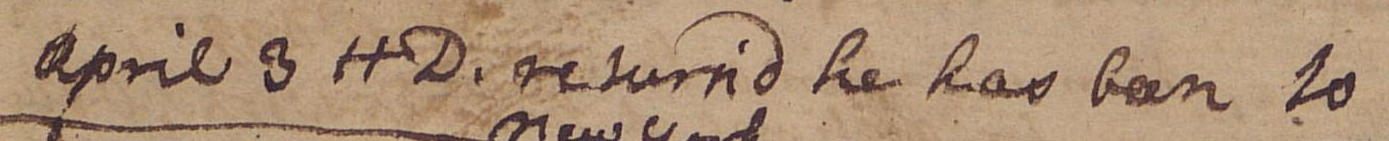April 3 HD. re return'd he has ban to
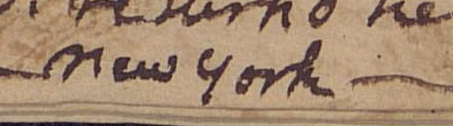New York-
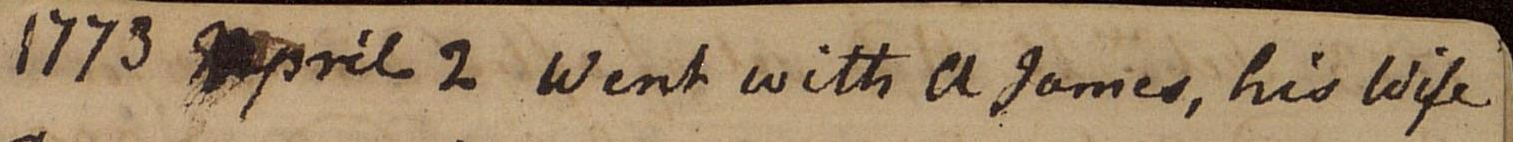1773 [A]pril 2 Went with A James, his Wife
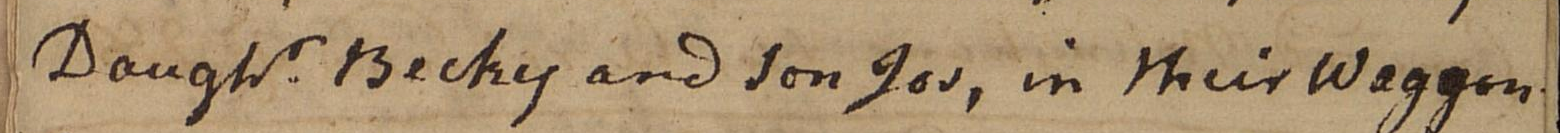Daugh^r. Becky and Son Jos, in their Waggon
